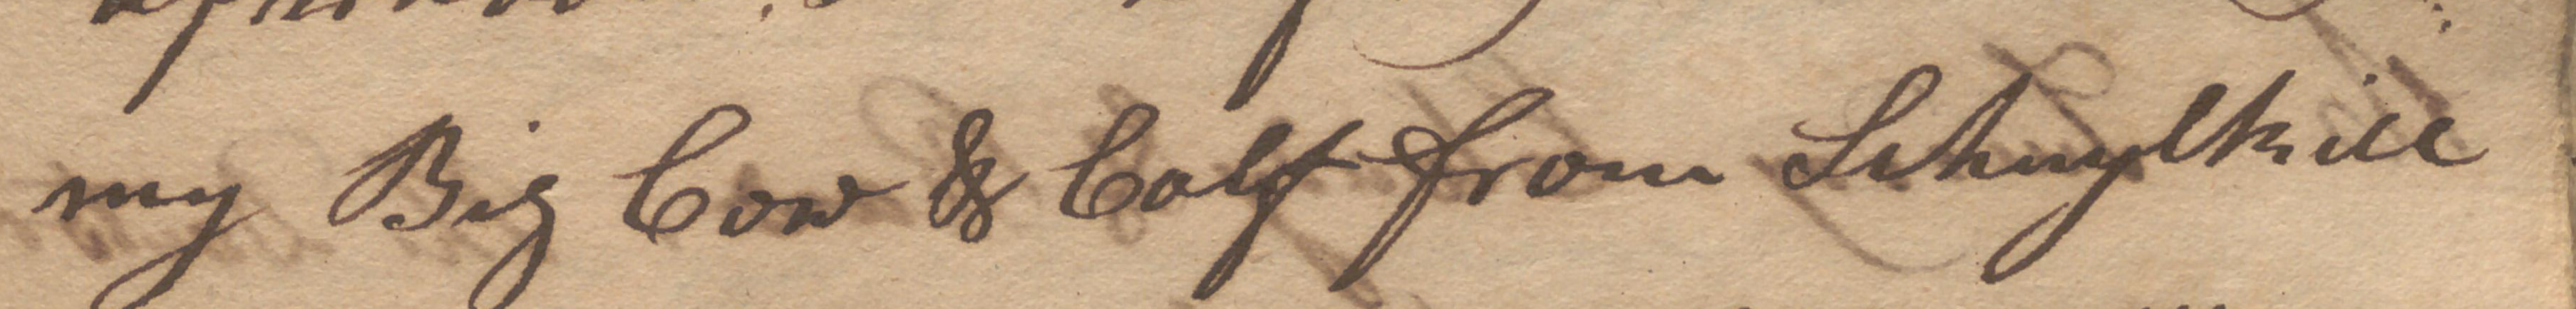my Big Cow & Calf from Schuylkill
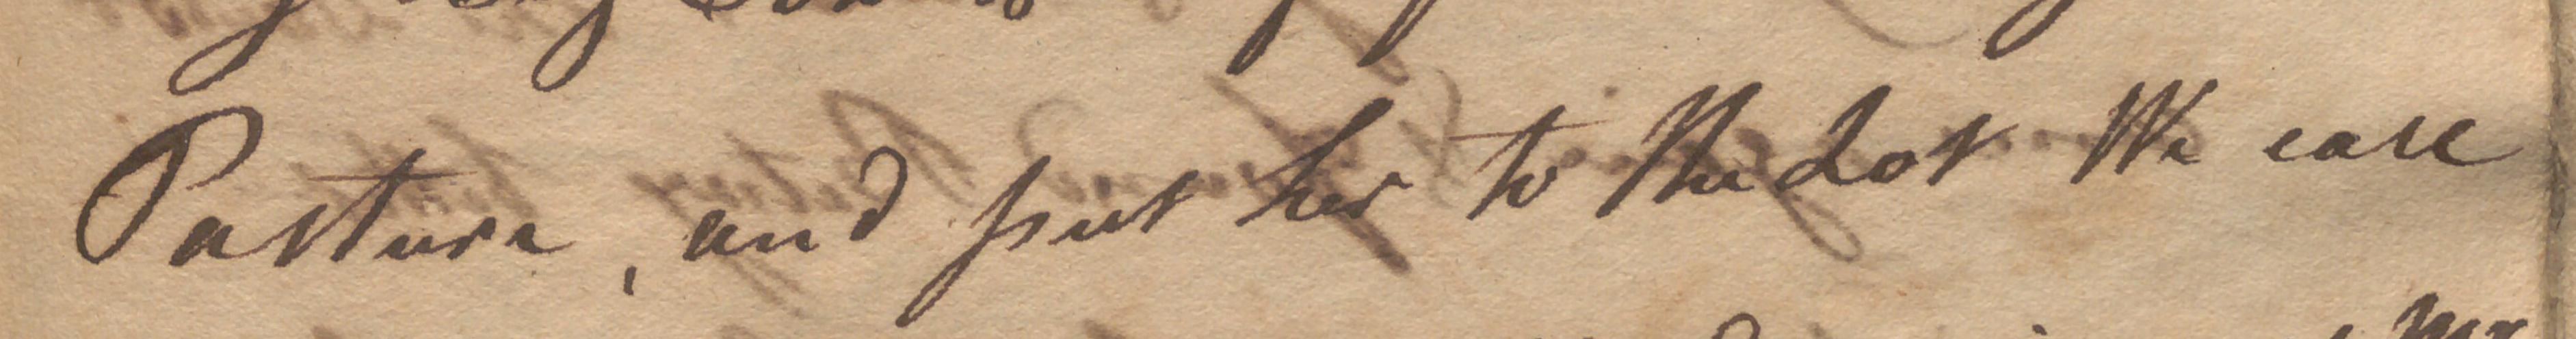Pasture, and put her to the Lot We call
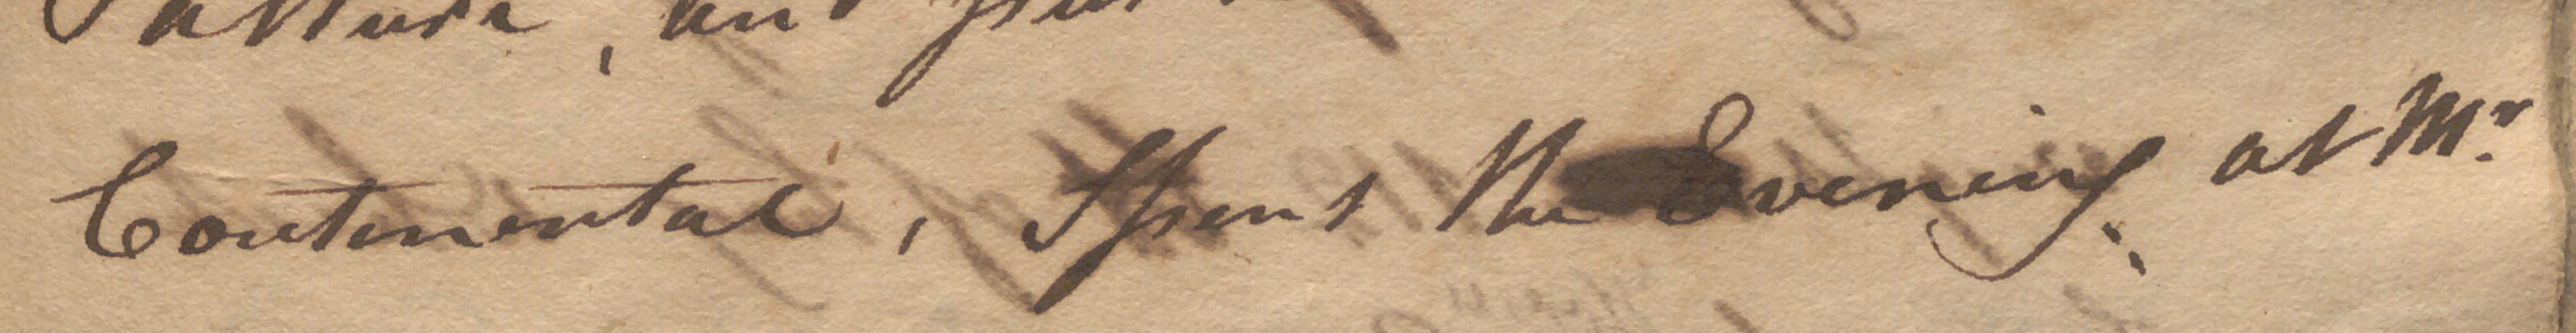Continental, spent the Evening at M^r.
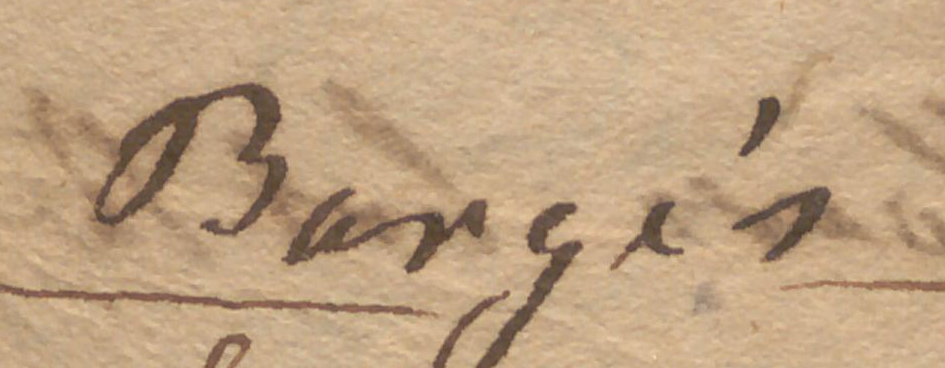Barge's
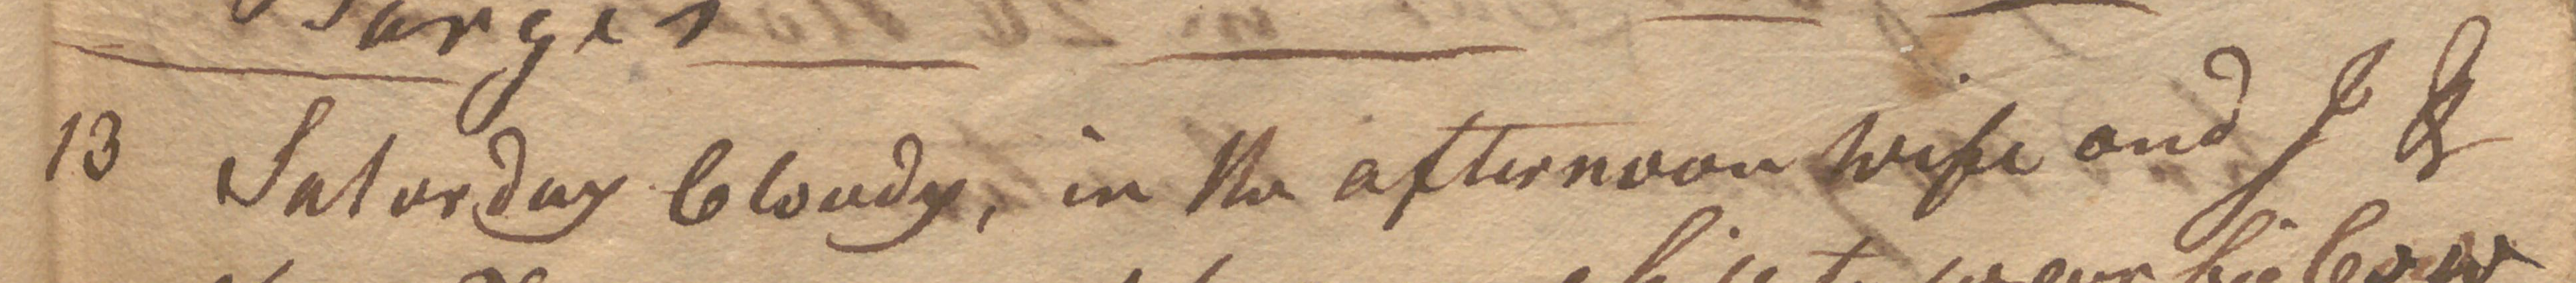13 Saturday Cloudy, in the afternoon wife and I &
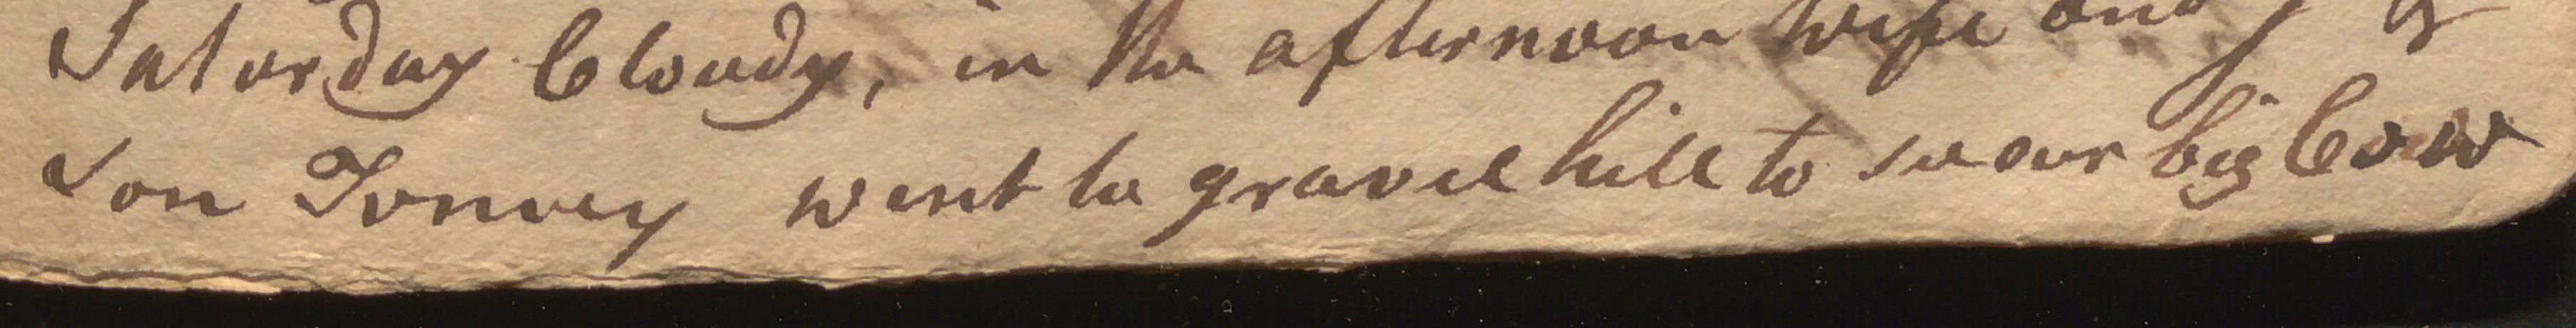Son Tomey went to gravel hill to see our big Cow
